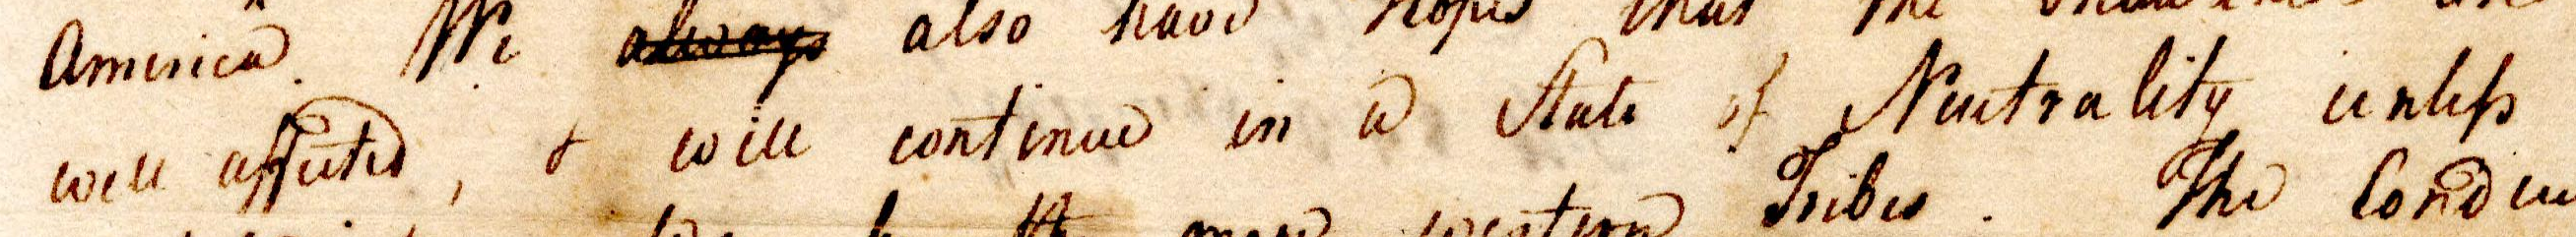well affected, & will continue in a State of Neutrality unless
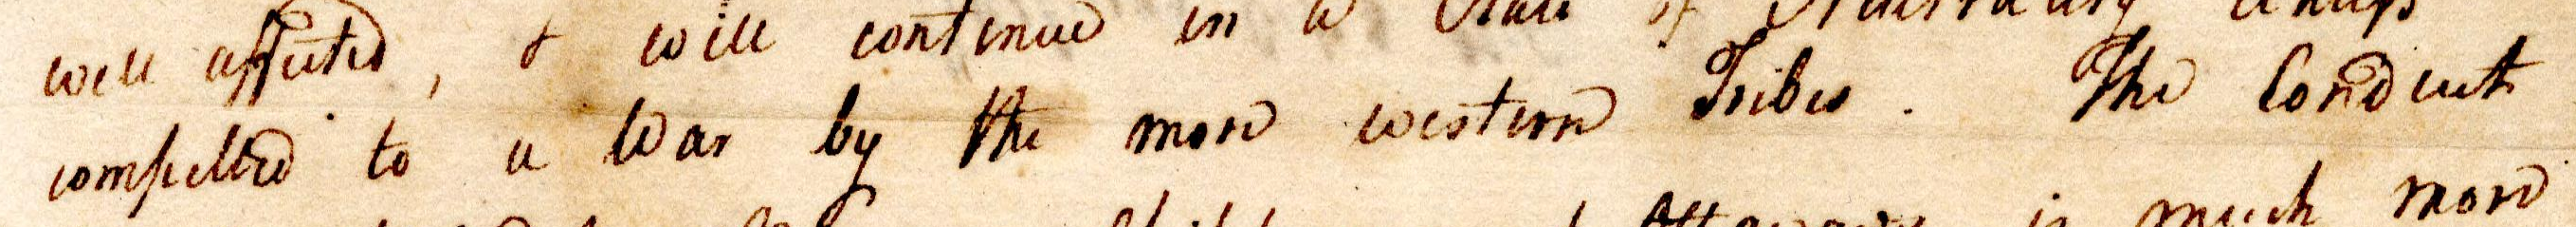compelled to a War by the more western Tribes. The Conduct
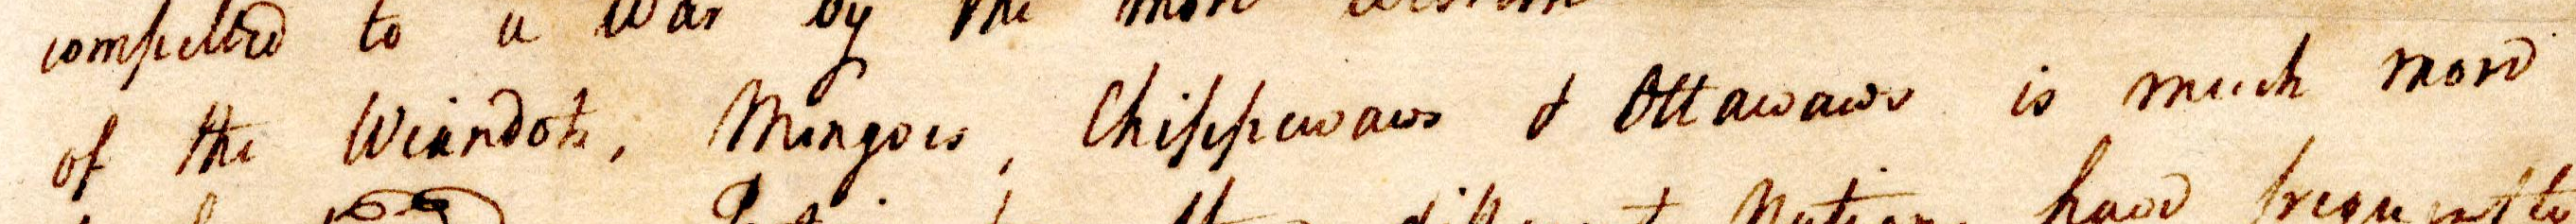of the Wiandot, Mingoes, Chippewaws & Ottawaws is much more
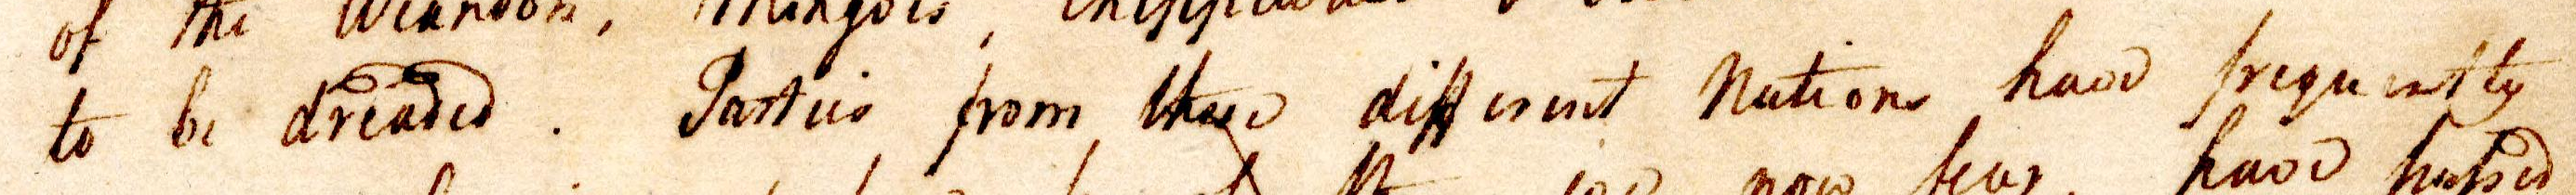to be dreaded. Parties from these different Nations have frequently
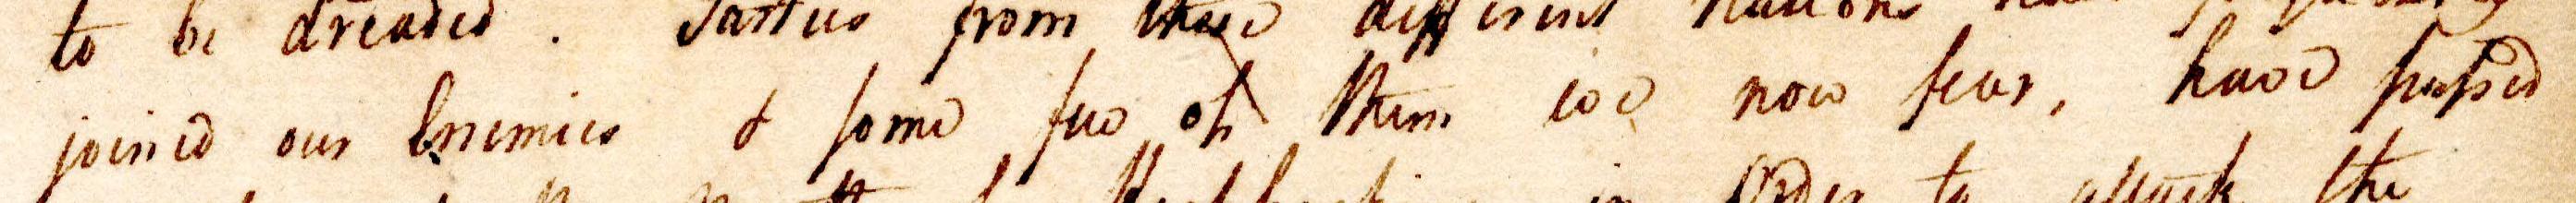joined our Enemies & some few of them we now fear, have passed
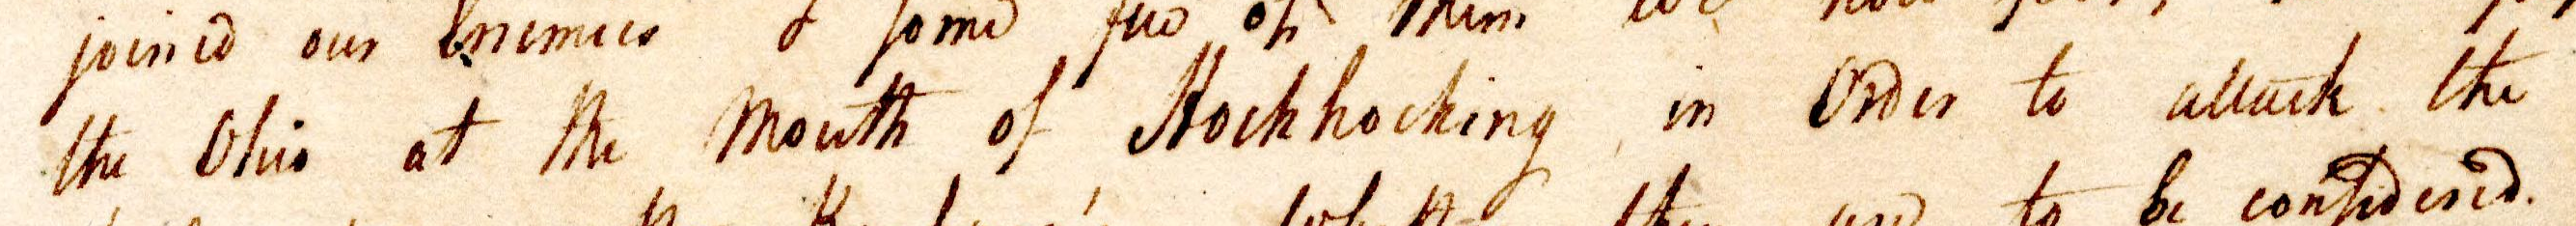the Ohio at the Mouth of Hockhocking in Order to attack the
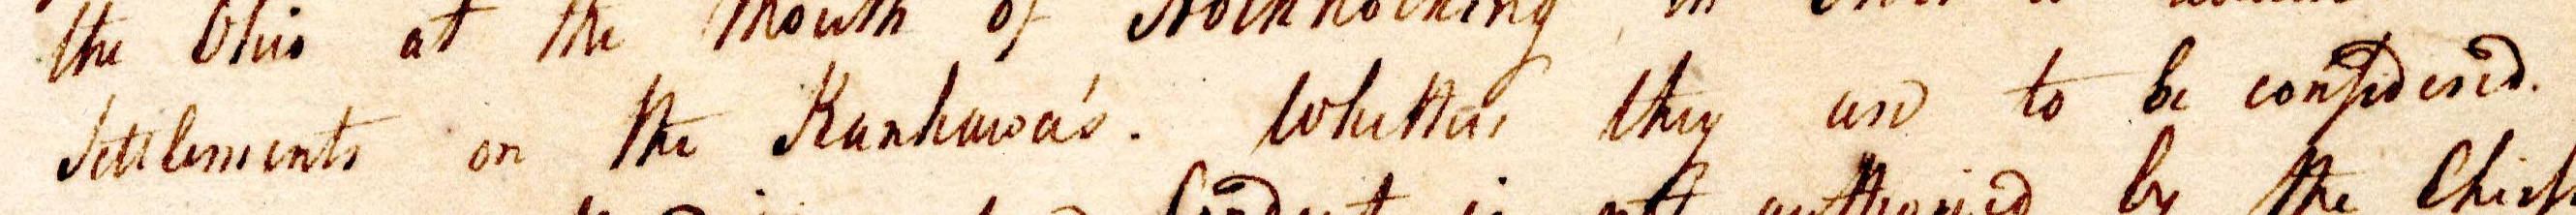Settlements on the Kanhawa's. Whether they are to be considered
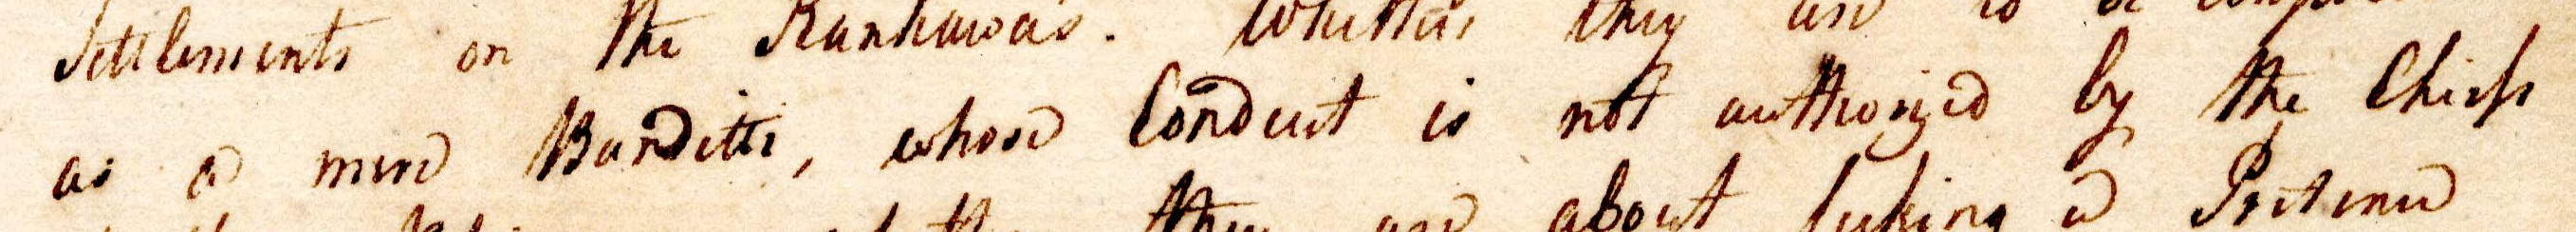as a mere Banditti, whose Conduct is not authorized by the Chiefs
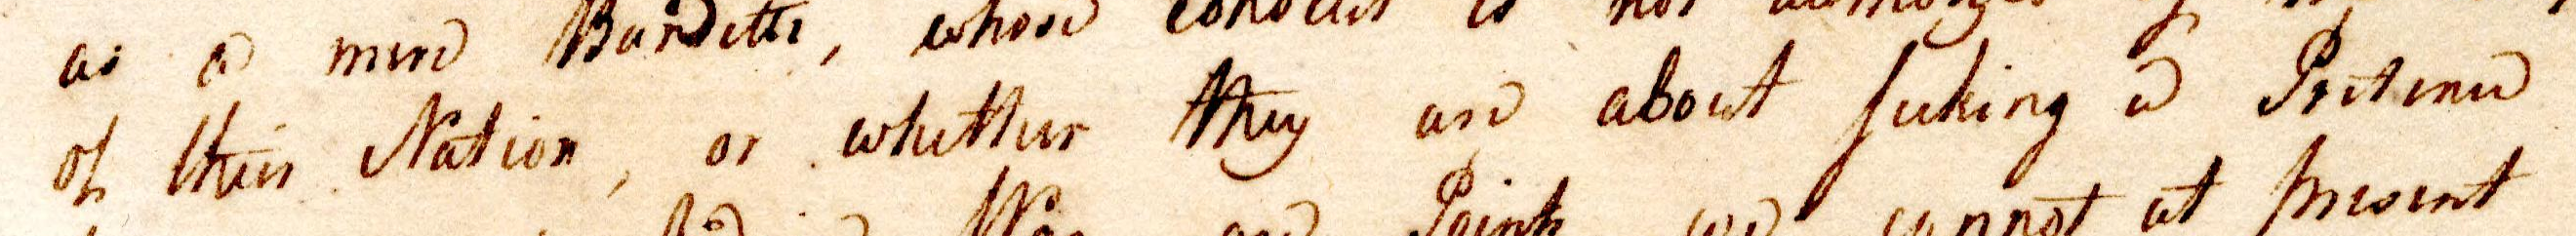of their Nation, or whether they are about seeking a Pretence
